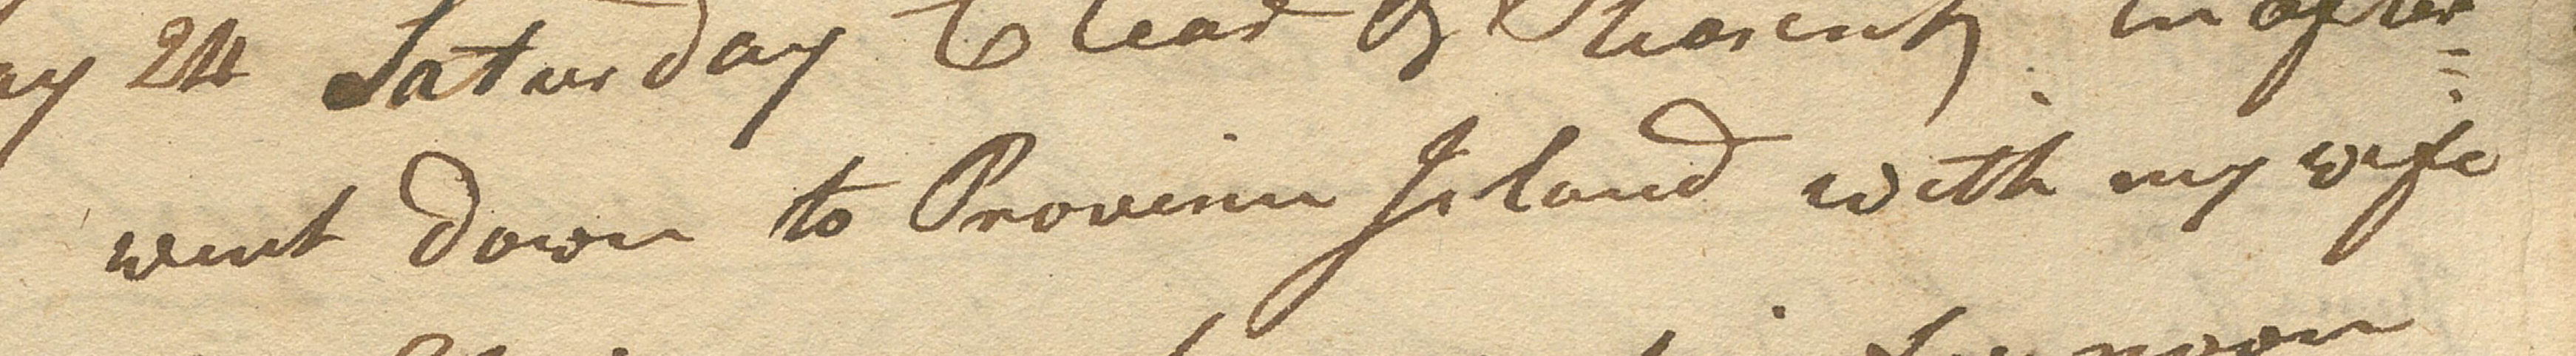went down to Province Island with my wife
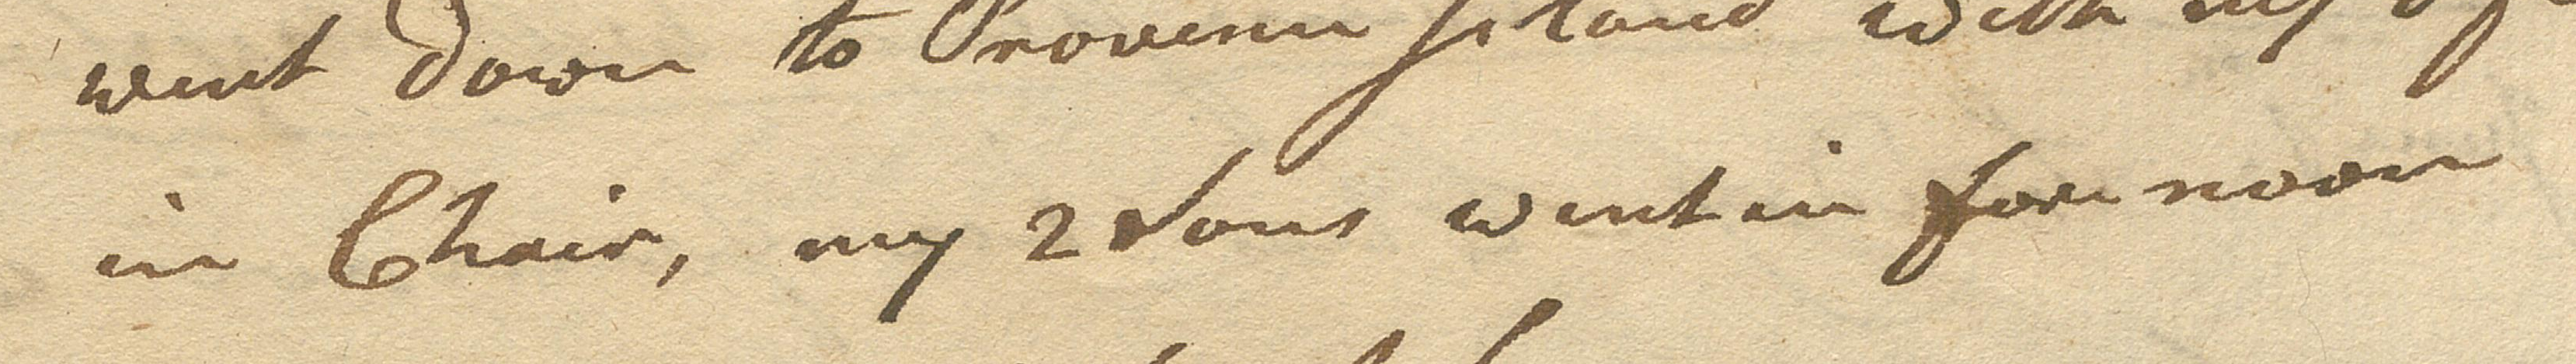in Chair, my 2 sons went in fore noon
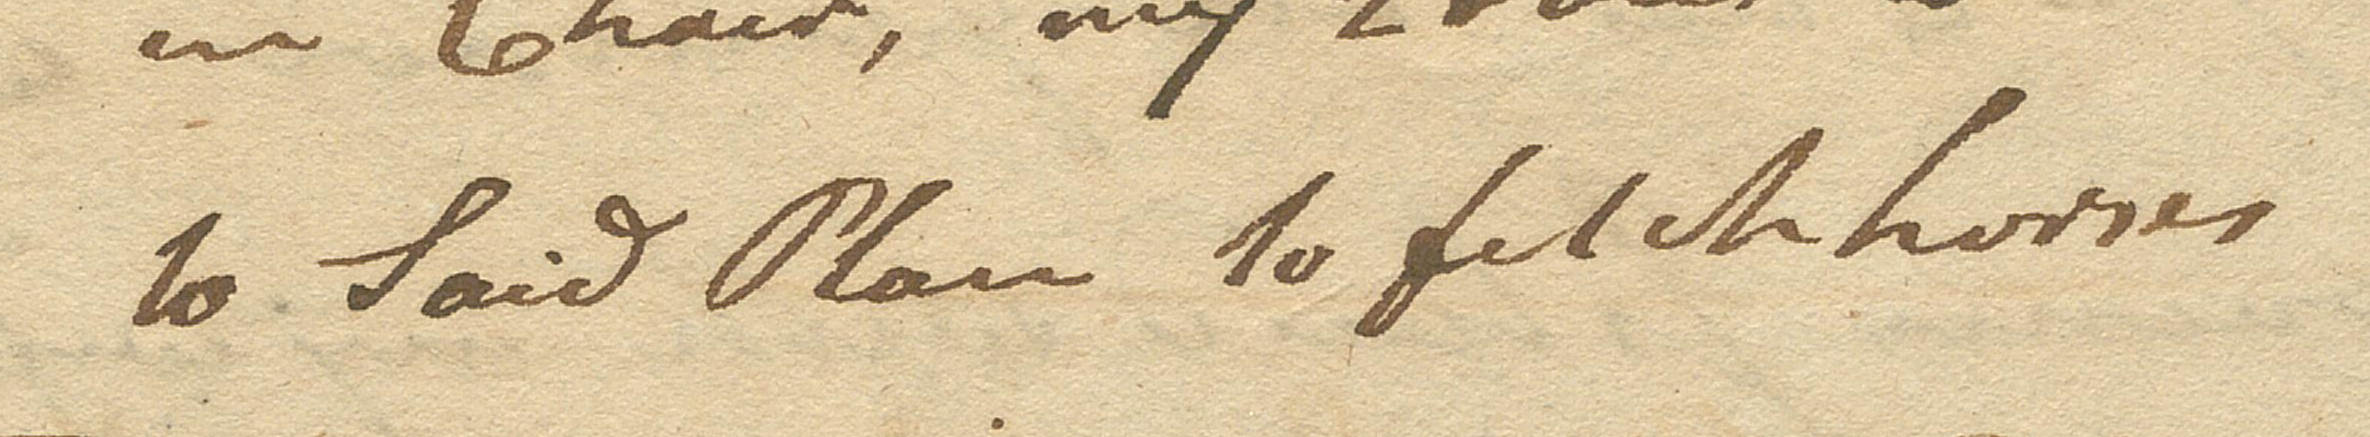to said Place to fetch horses
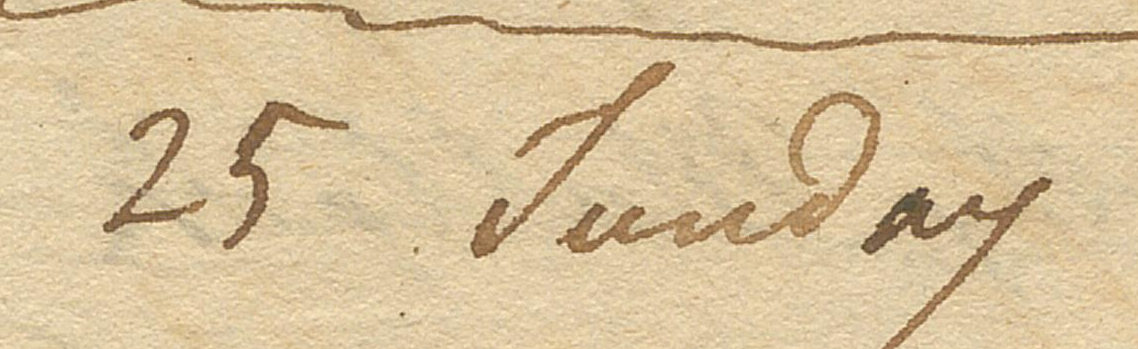25 Sunday
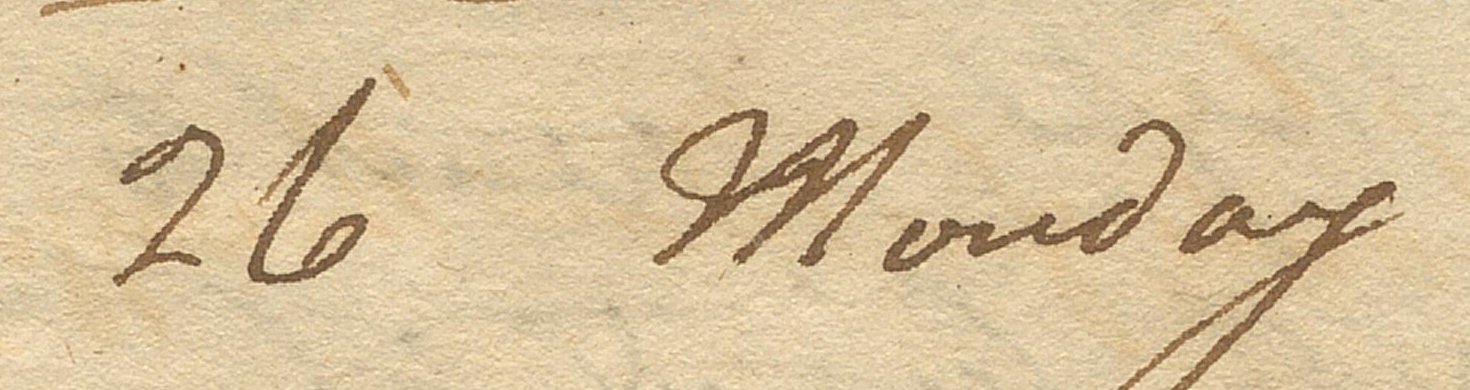26 Monday
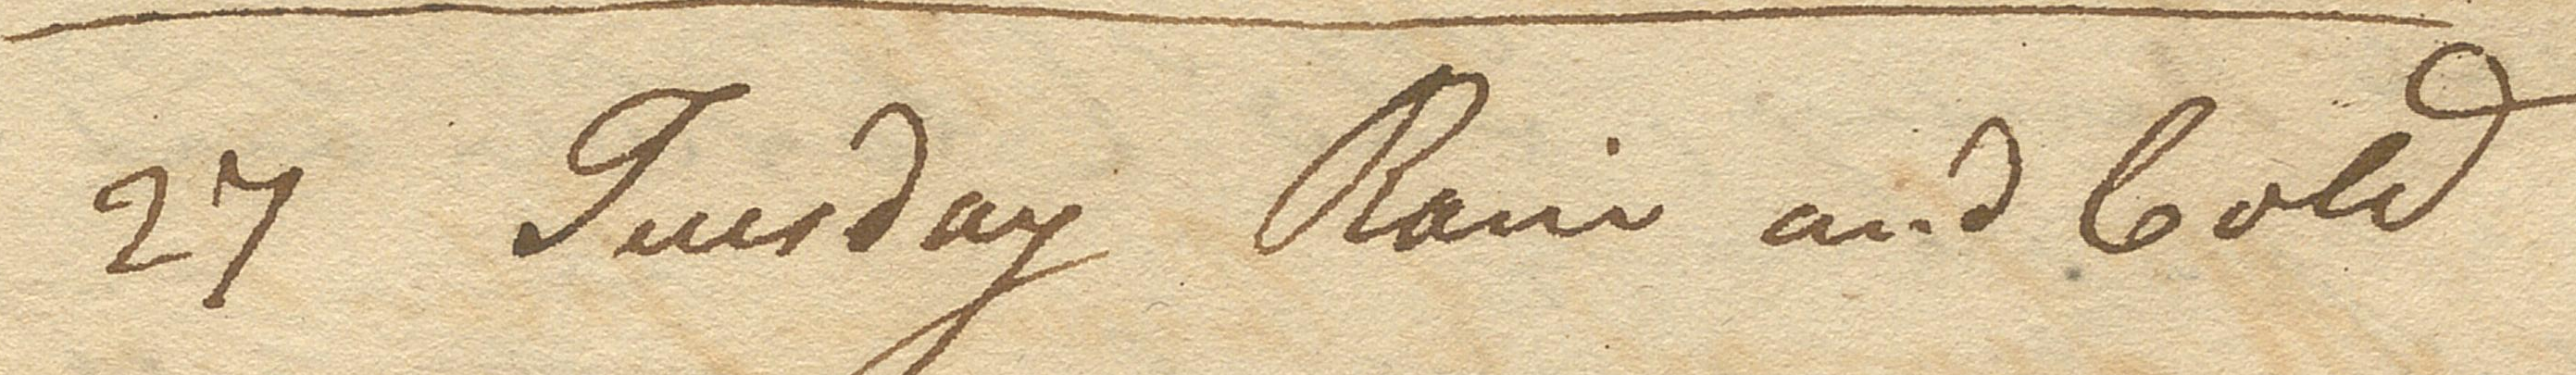27 Tuesday Rain and Cold
